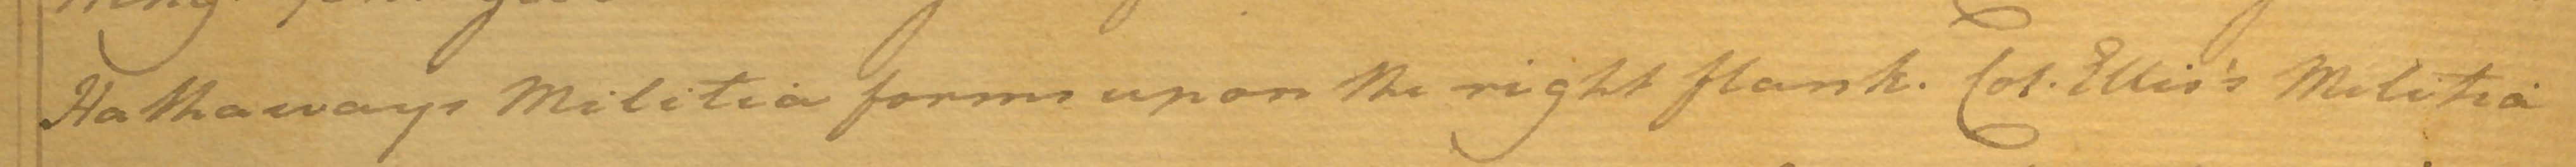Hathaways Militia forms upon the right flank. Col. Ellis's Militia
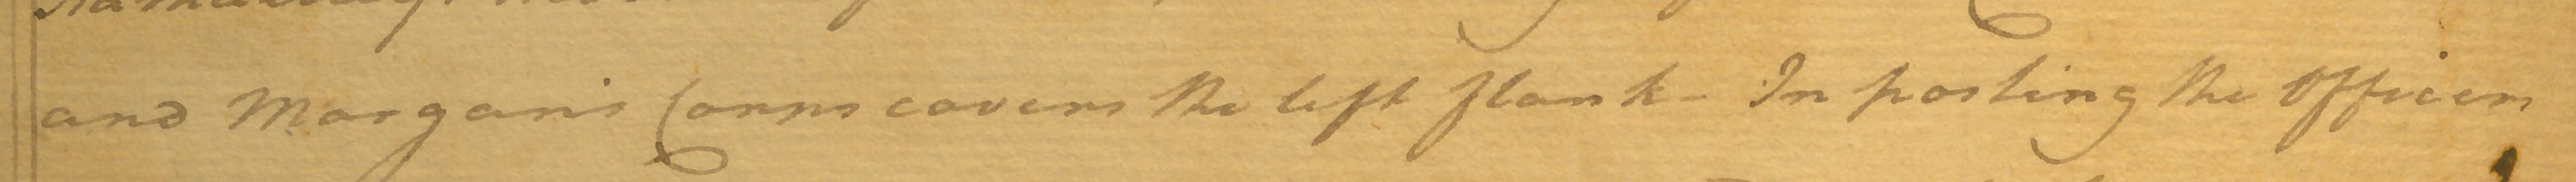and Morgan's Corps covers the left flank- In posting the Officers
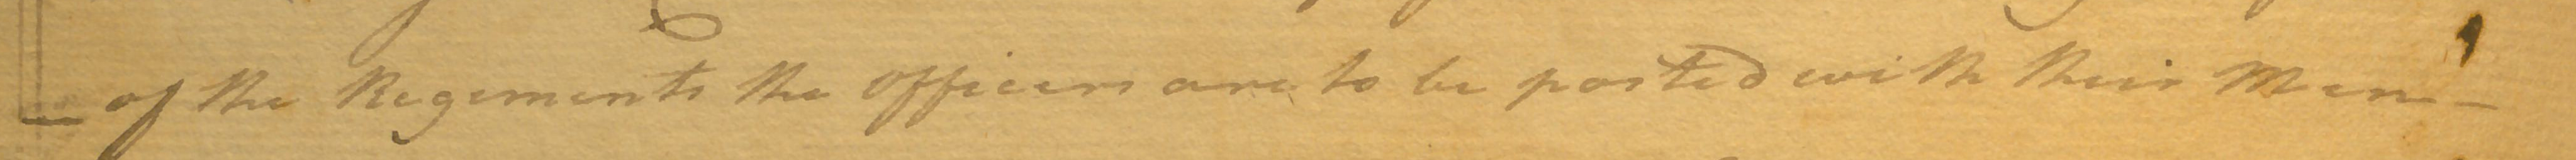- of the Regiments the Officers are to be posted with their Men-
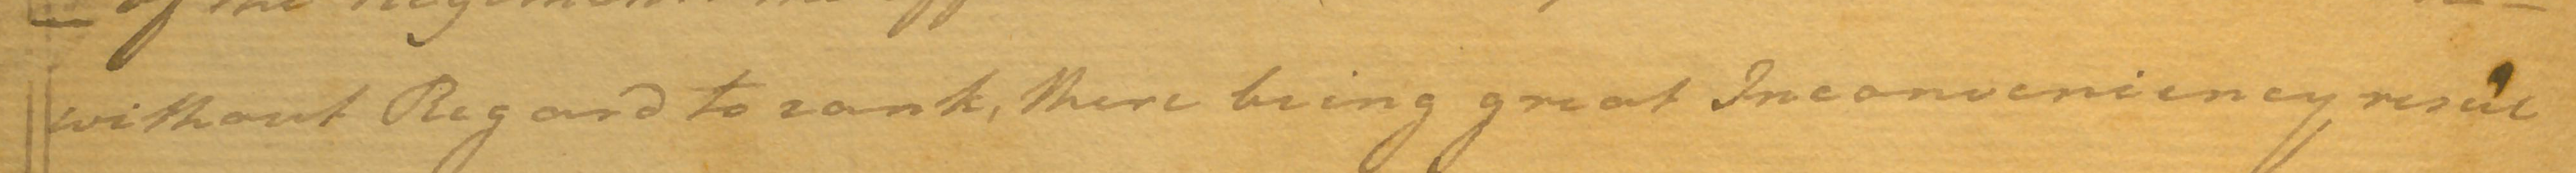without Regard to rank, there being great Inconveniency resul
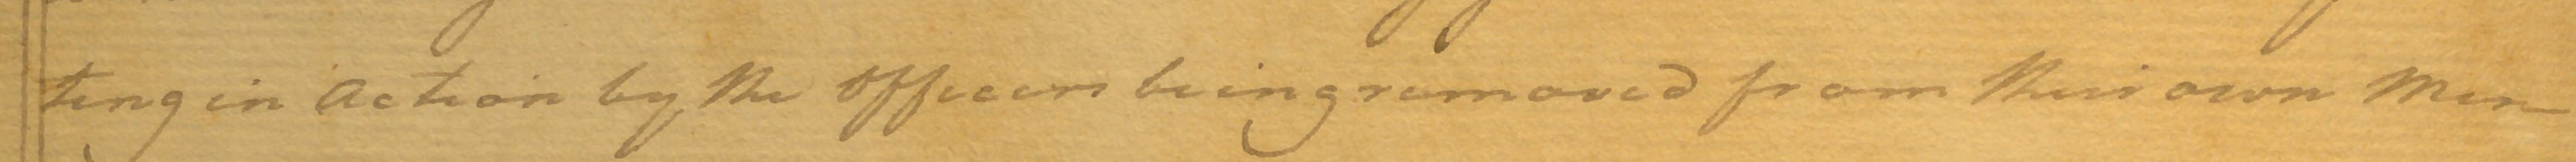ting in Action by the Officers being removed from their own Men
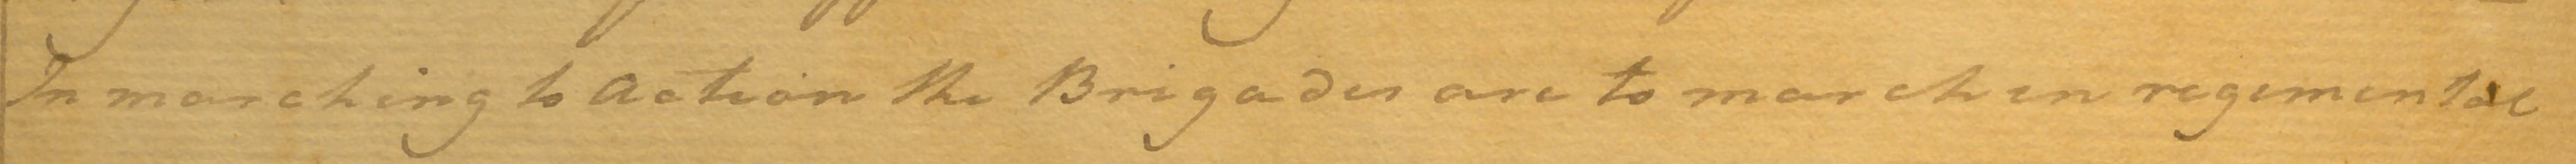In marching to Action the Brigades are to march in regimental
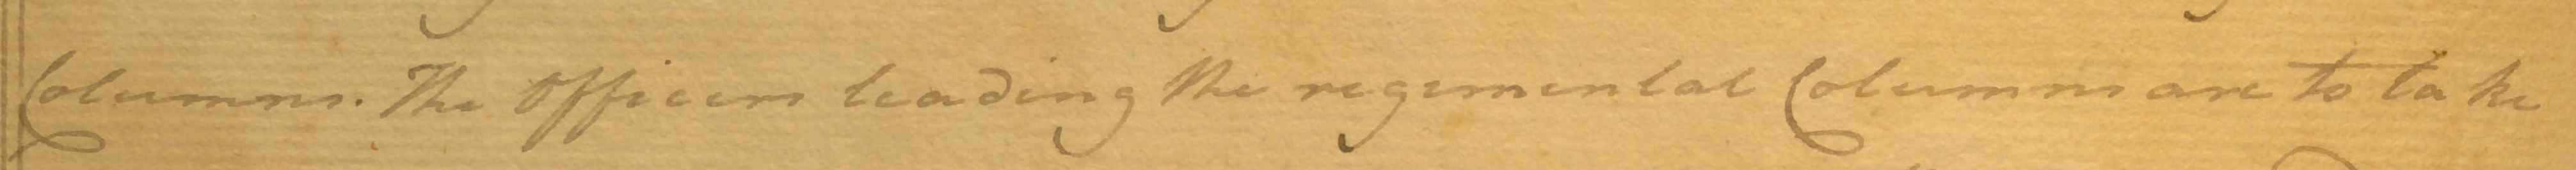Columns. The Officers leading the regimental columns are to take
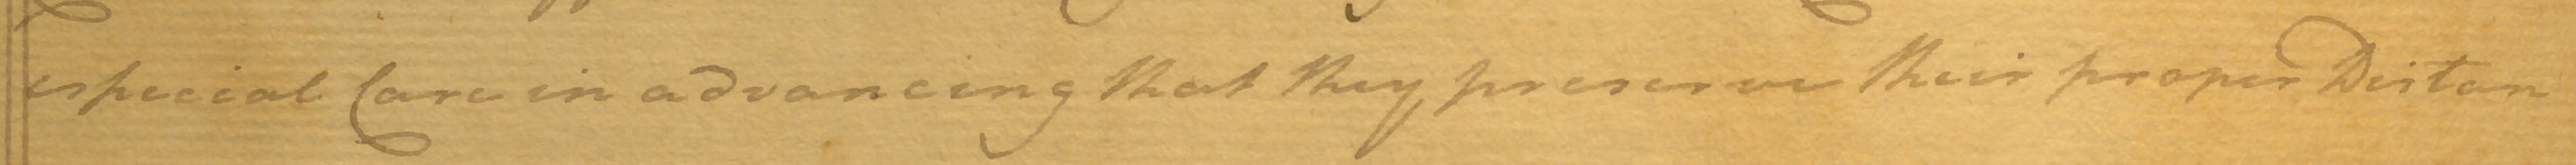especial Care in advancing that they preserve their proper Distan
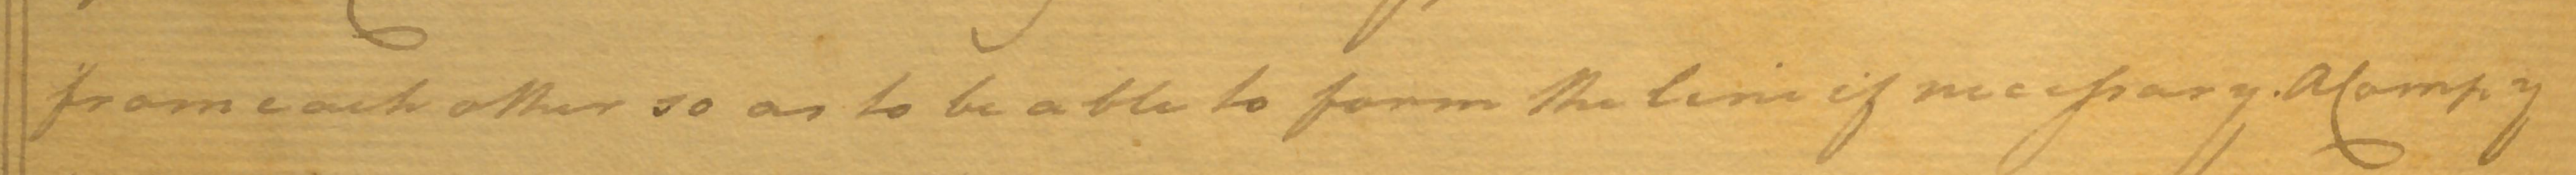from each other so as to be able to form the line if necessary. A Comp^y
